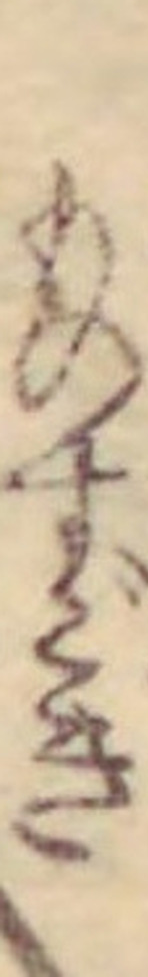ものすごき
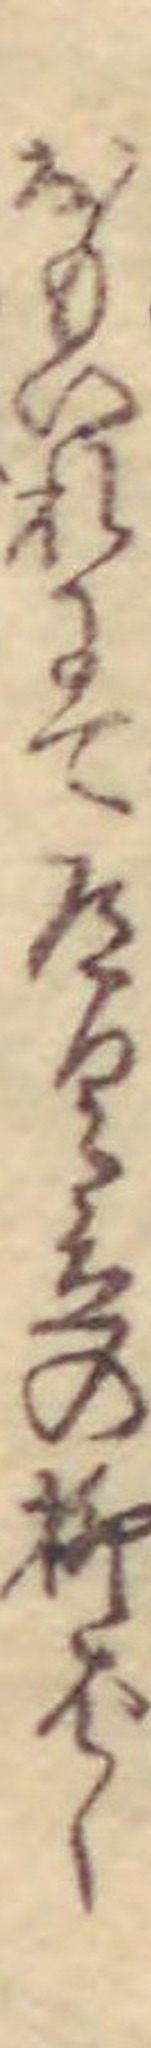おもいれにて道具立の柳ばし
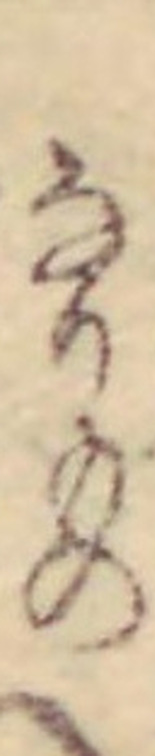なりもの
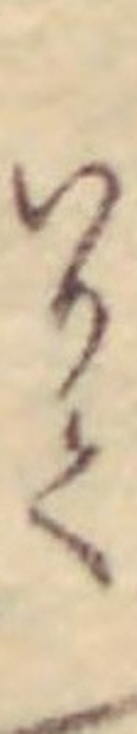いりて
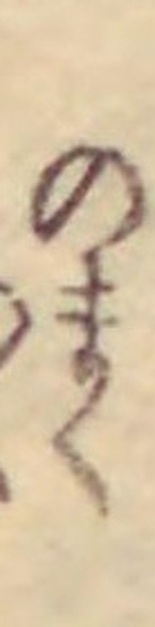のまく
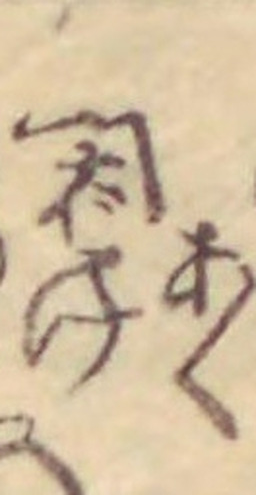〽ばけ
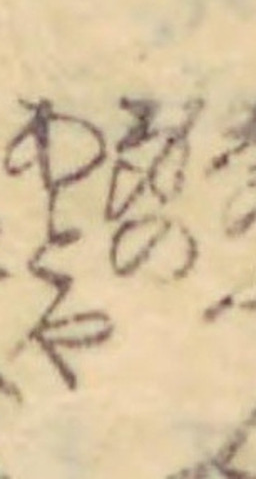あとや
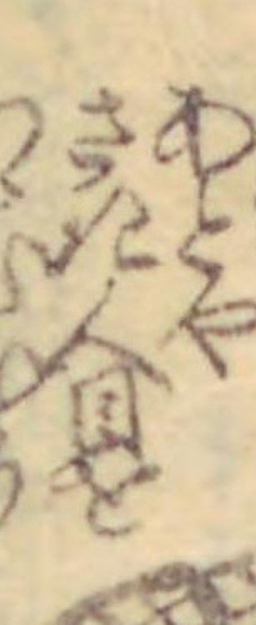さき人目を
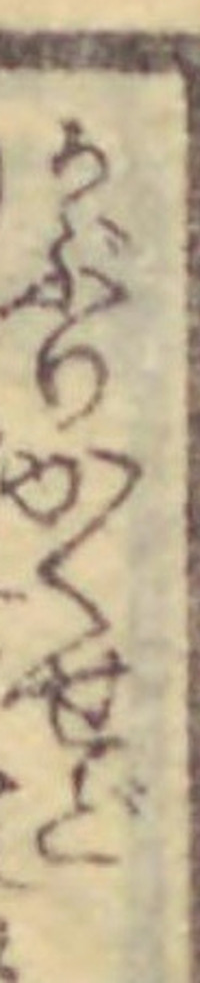かぶりかくせど
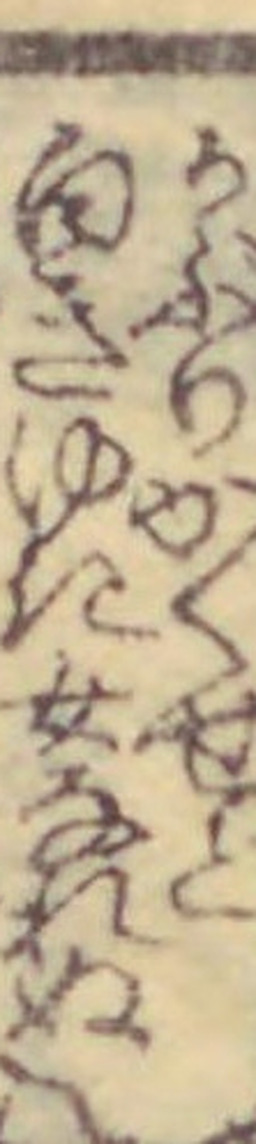白きゆき女なれぬ
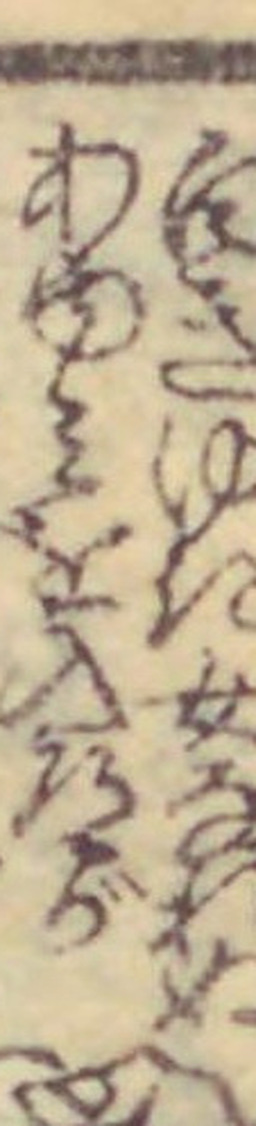あゆみを入道が
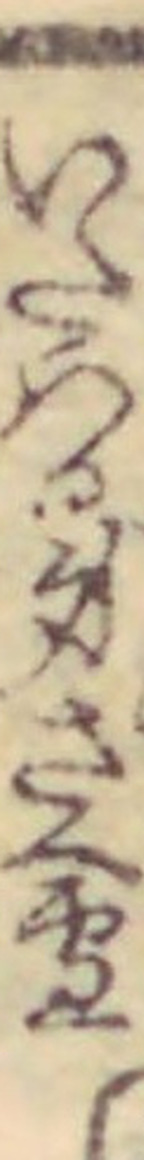いたはる身さへ雪
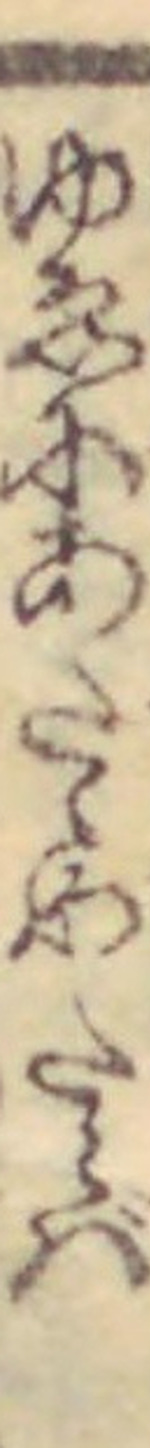ゆゑにあたゝめたらば
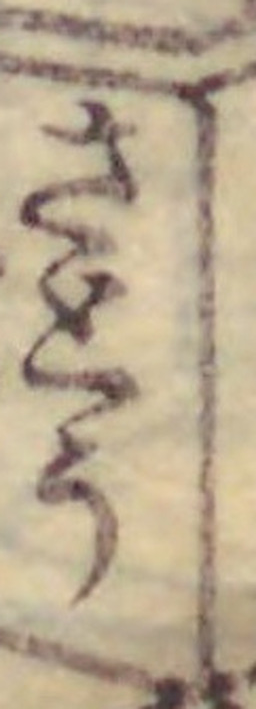さとう
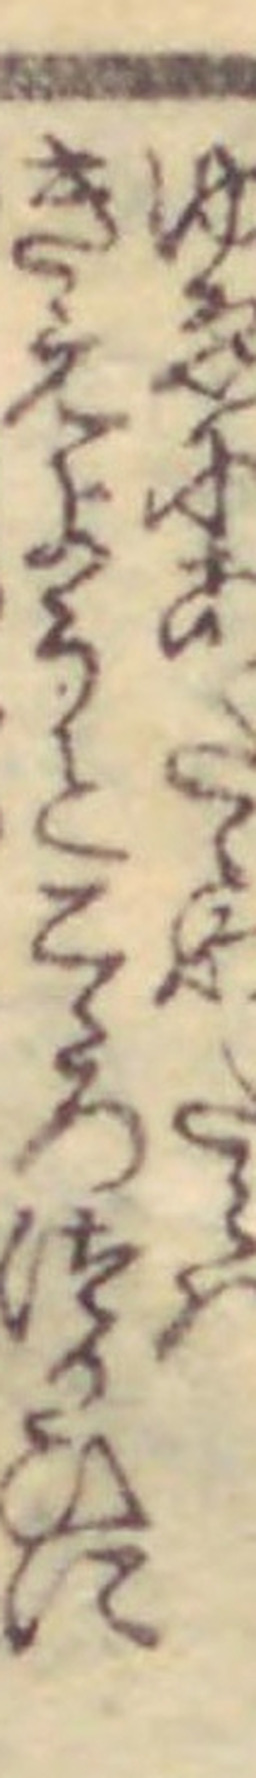きえようとこゝろつかひに
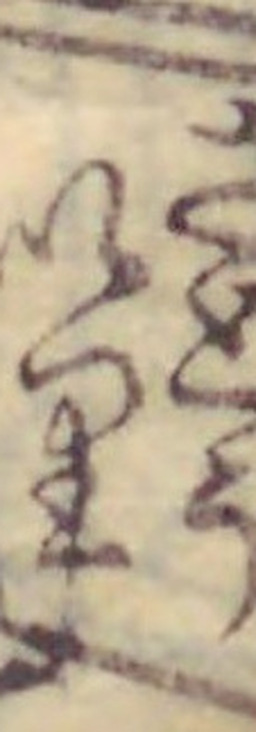いりて
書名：化物世帯氣質
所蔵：国立国会図書館 National Diet Library, JAPAN
